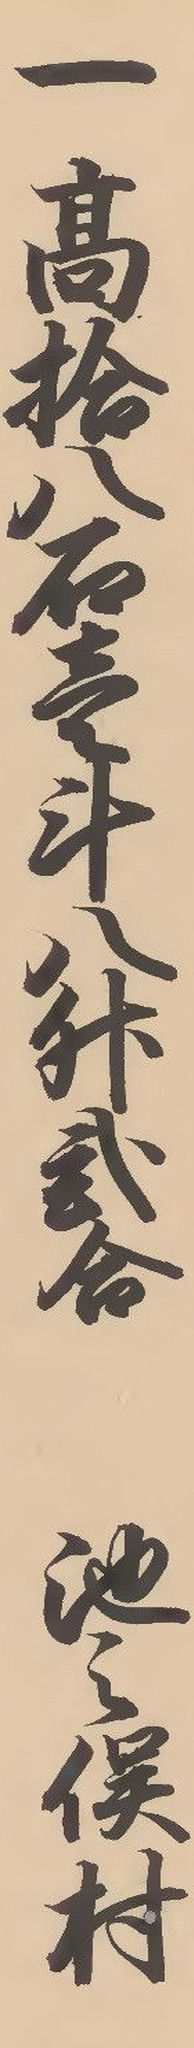一高拾八石壱斗八升弐合池之俣村
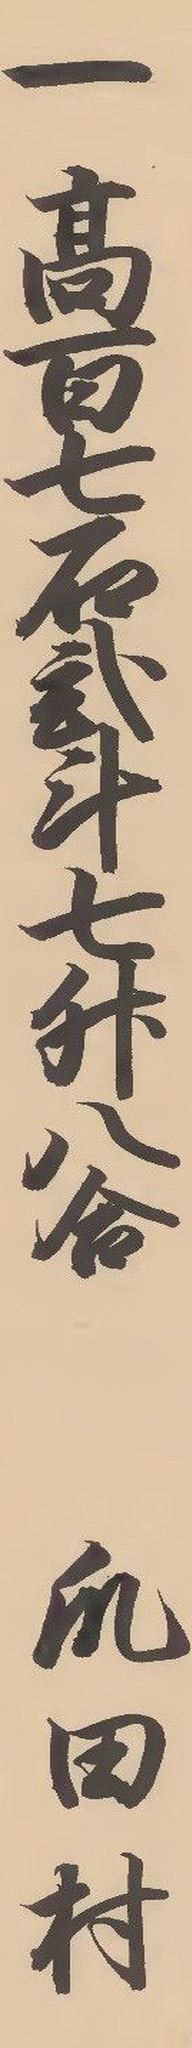一高百七石弐斗七升八合爪田村

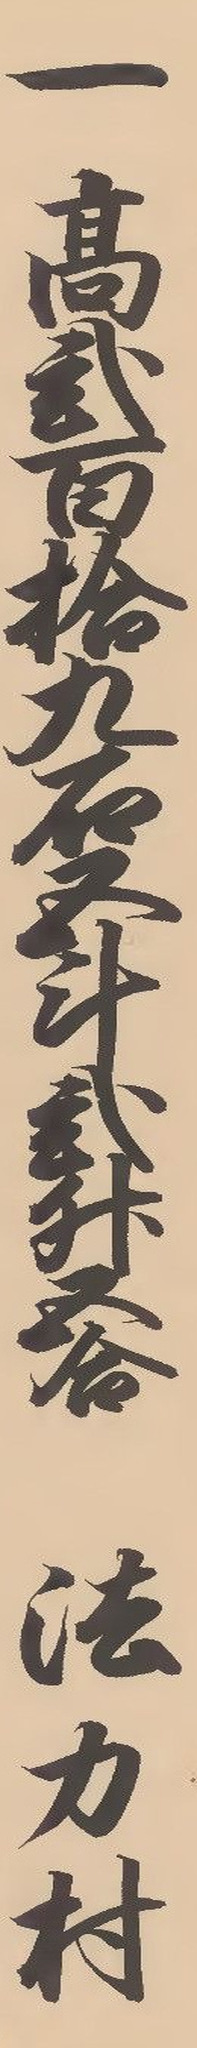一高弐百拾九石五斗弐升五合法力村
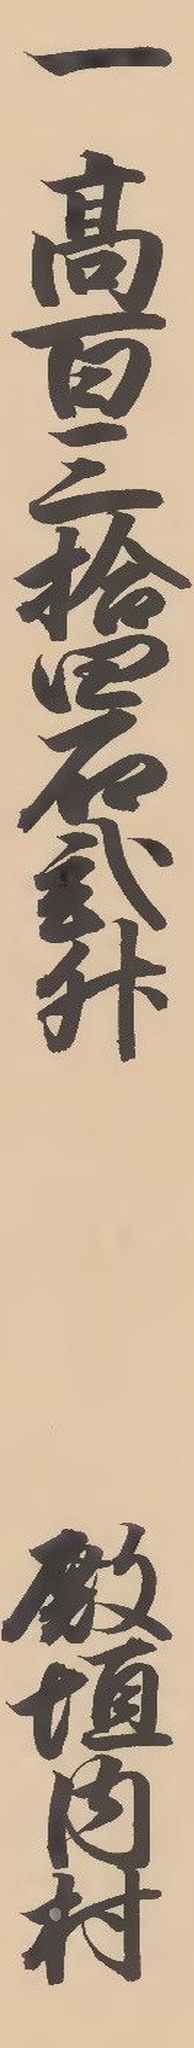一高百三拾四石弐升殿垣内村
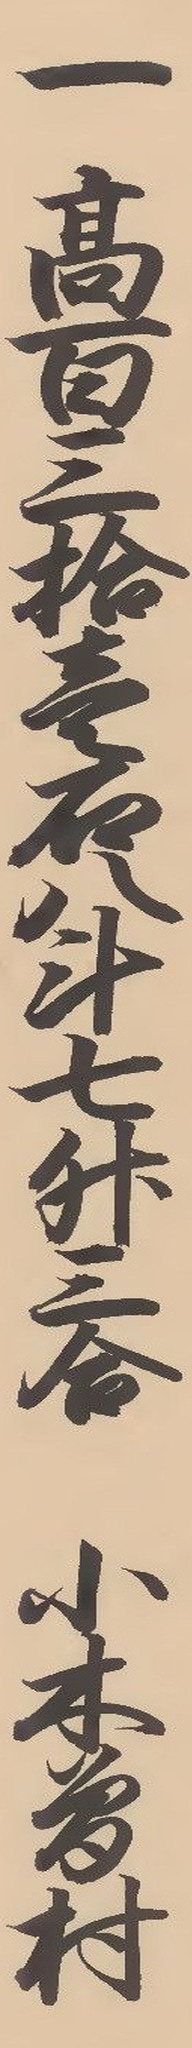一高百三拾壱石八斗七升三合小木曽村
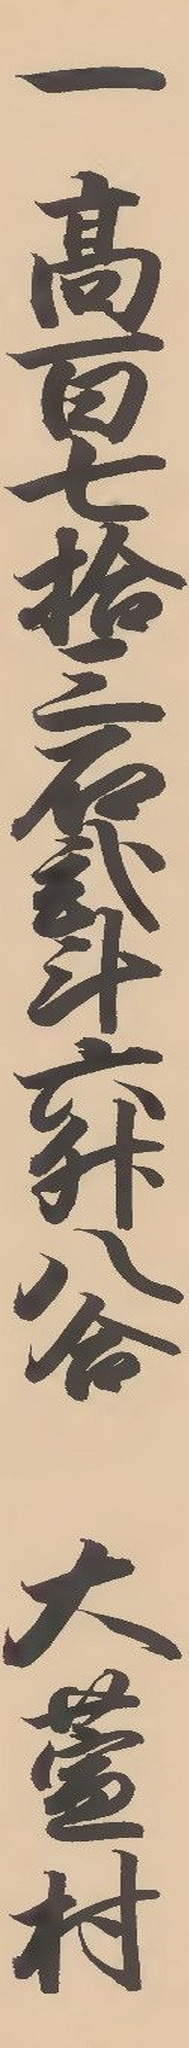一高百七拾三石弐斗六升八合大萱村
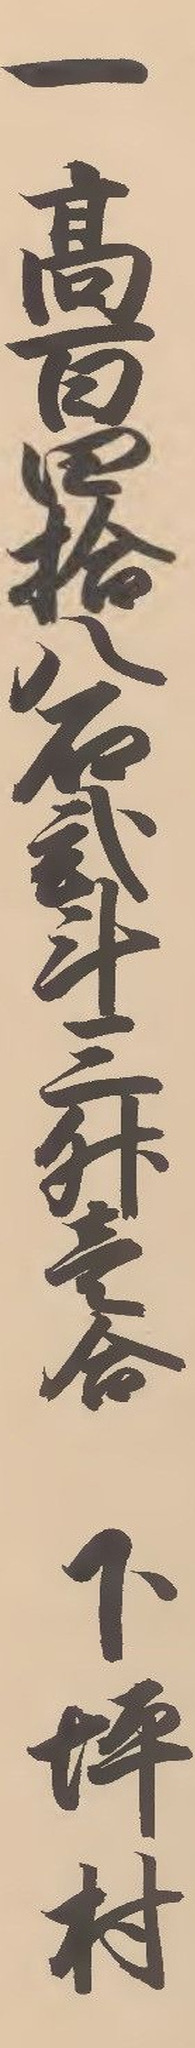一高百四拾八石弐斗三升壱合下坪村
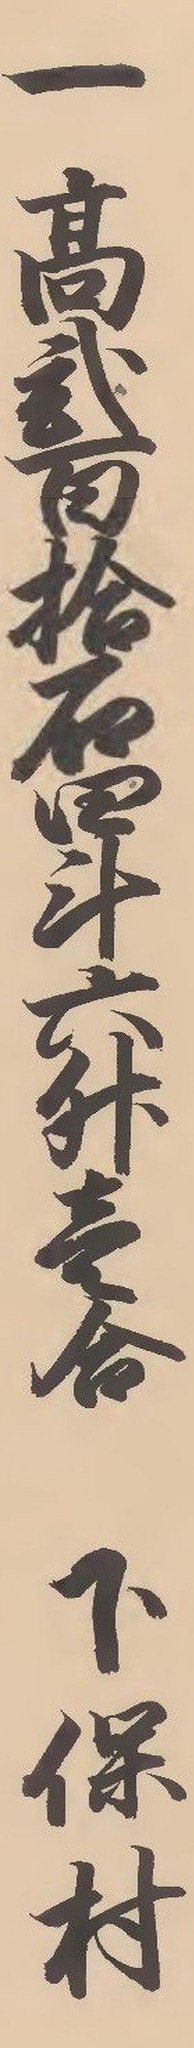一高弐百拾石四斗六升壱合下保村
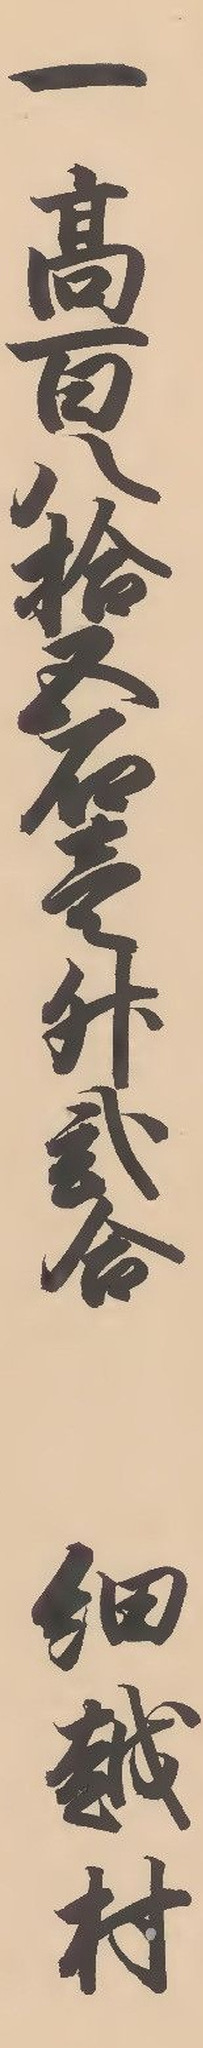一高百八拾五石壱升弐合細越村
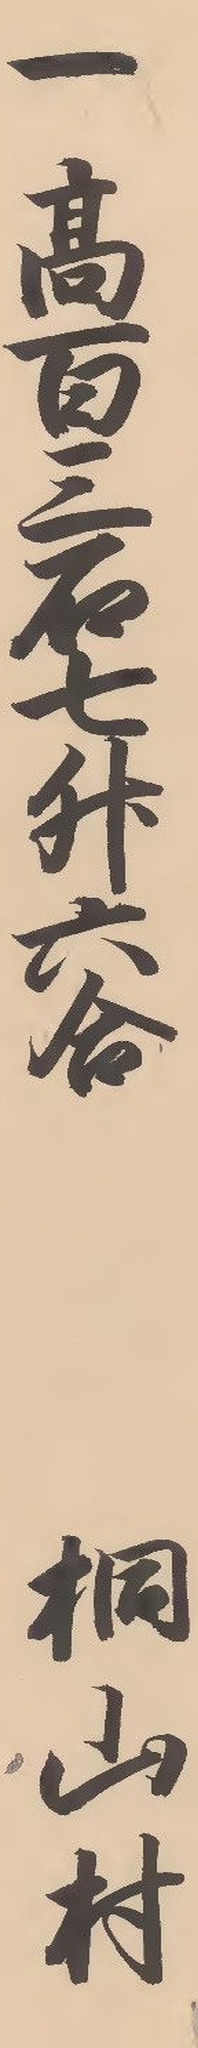一高百三石七升六合桐山村

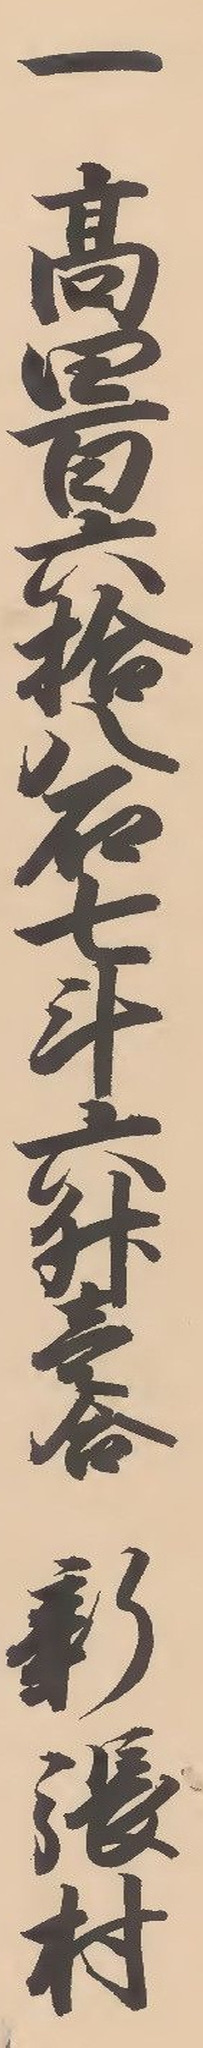一高四百六拾八石七斗六升壱合新張村
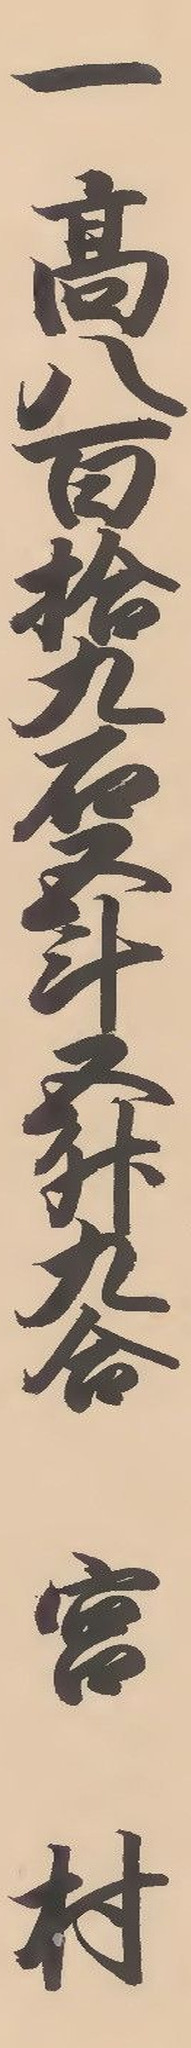一高八百拾九石五斗五升九合宮村
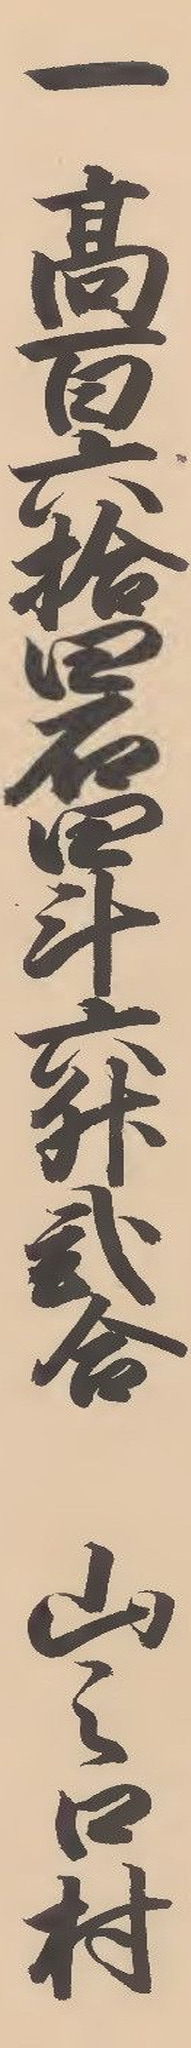一高百六拾四石四斗六升弐合山之口村
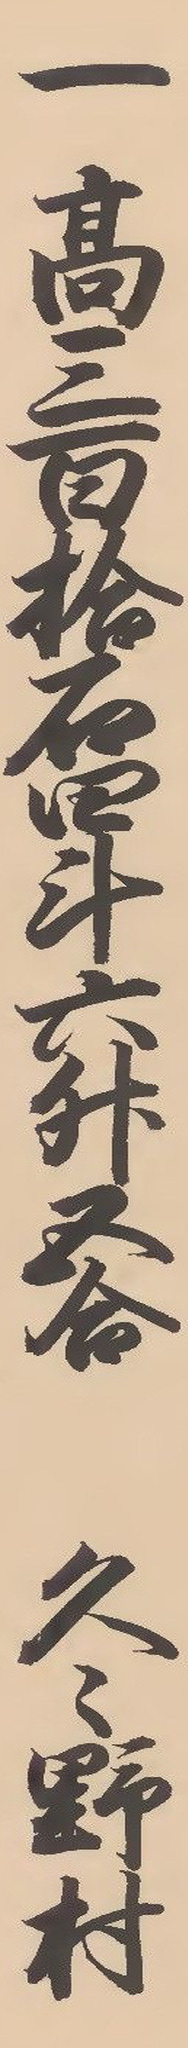一高三百拾石四斗六升五合久々野村
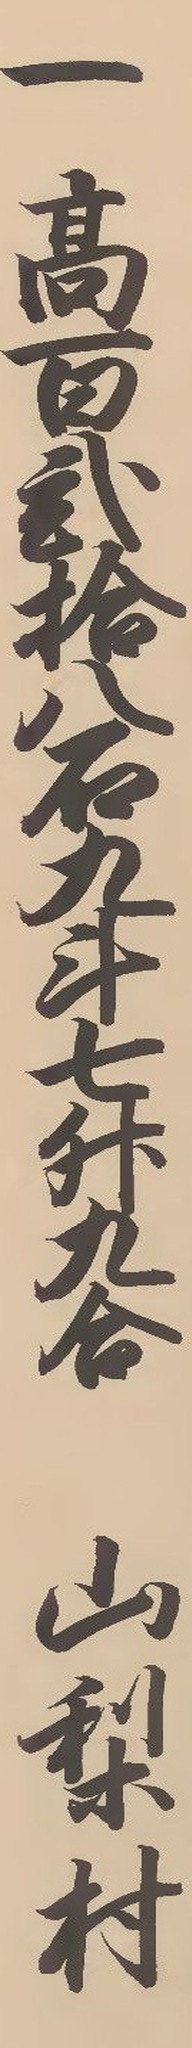一高百弐拾八石九斗七升九合山梨村
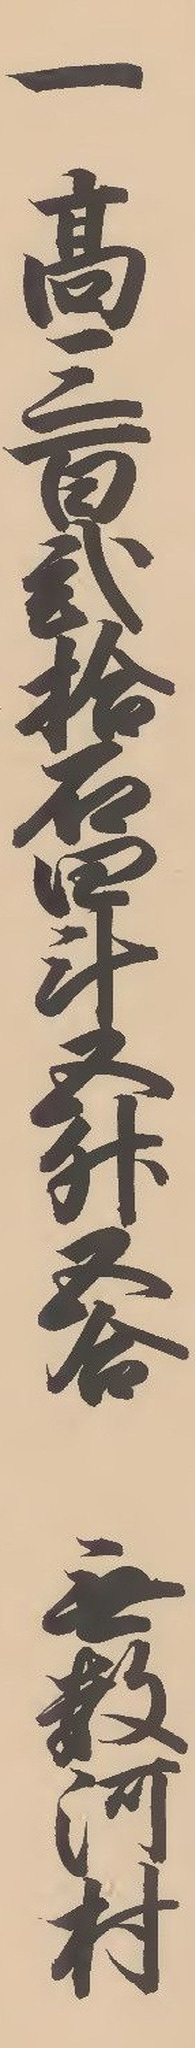一高三百弐拾石四斗五升五合無数河村
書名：飛騨国郷帳
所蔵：国立公文書館 National Archives of Japan
